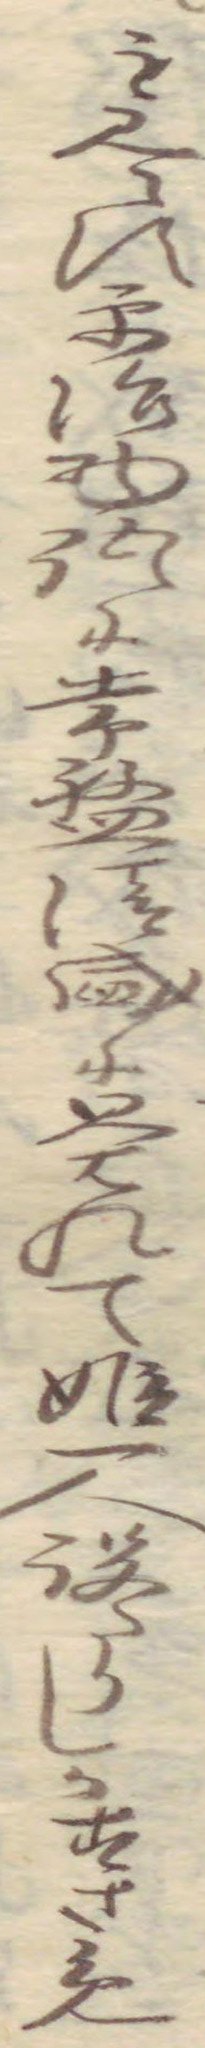も見えす平治物語に常盤清盛に思はれて姫一人設たりしかすさめ
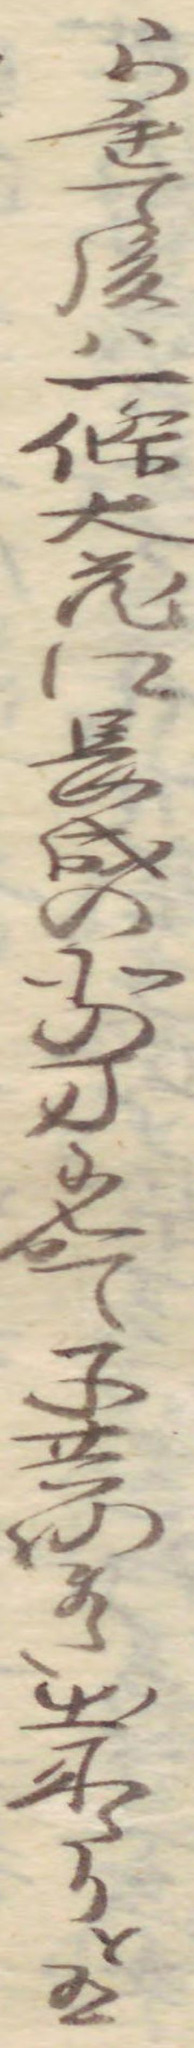られて後は一条大蔵卿長成の北の方に成て子共あまた出来たりと有
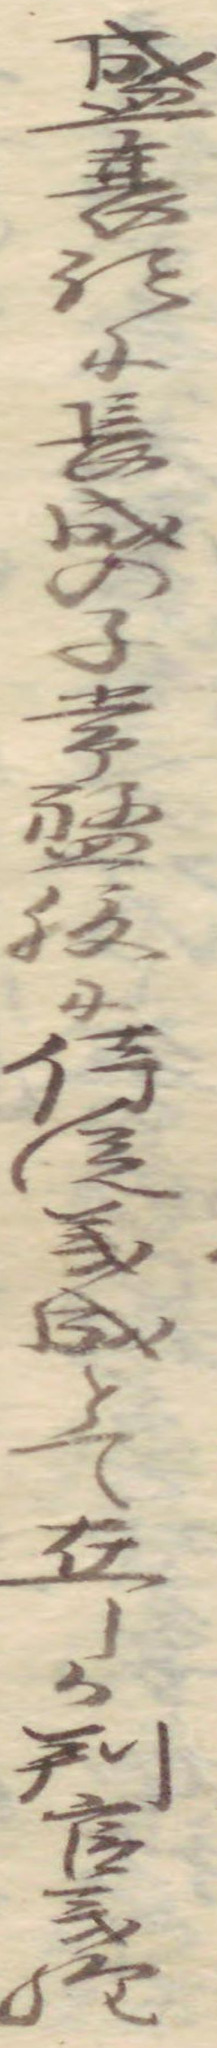盛衰記に長成の子常盤腹に侍従義成とて在しか判官義経
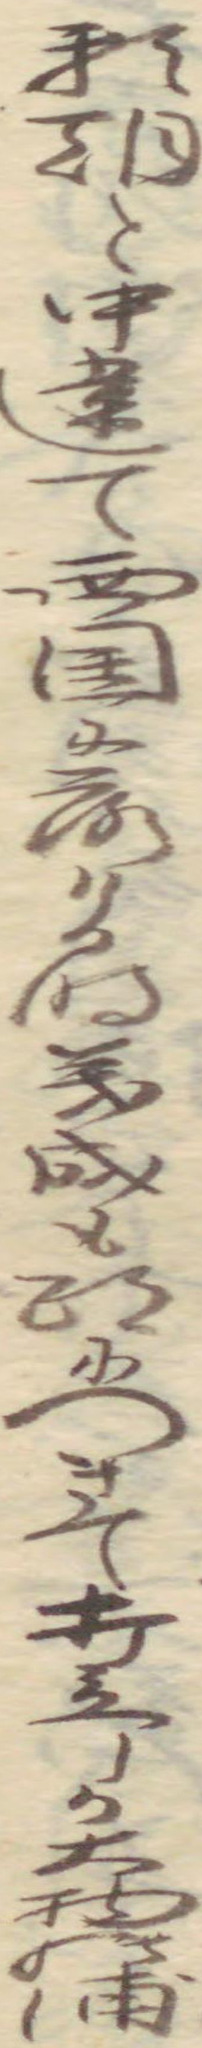頼朝と中違て西国に落ける時義成も跡につきて打立しか大物の浦
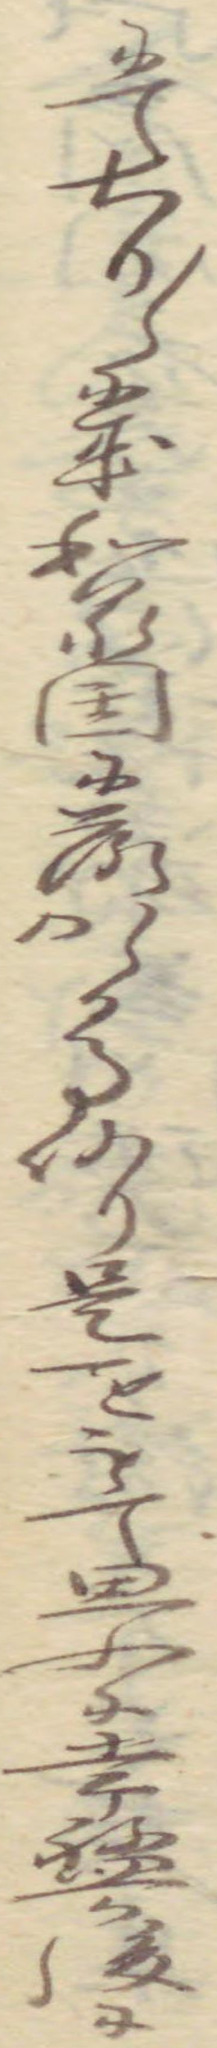にてちり〳〵に成和泉国に落かゝる事あり是をもて思ふに常盤か後に
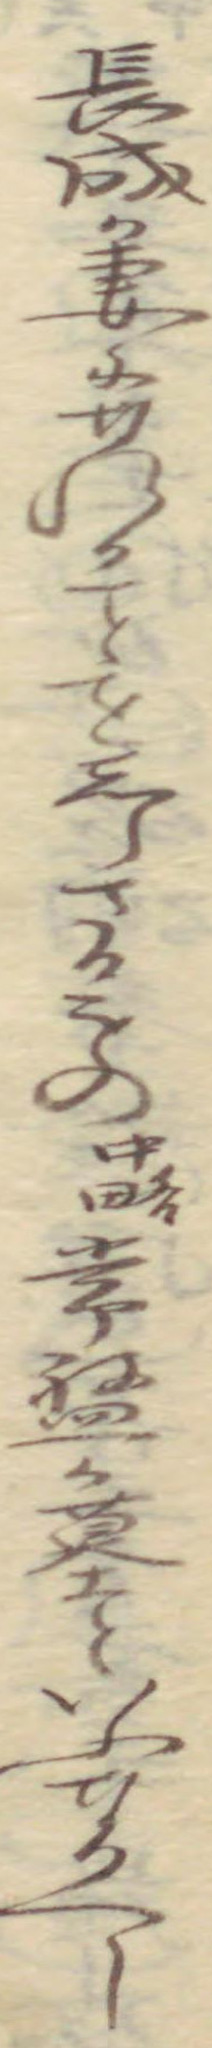長成か妻になれることをしらさるもの中略常盤か墓といふなるへし
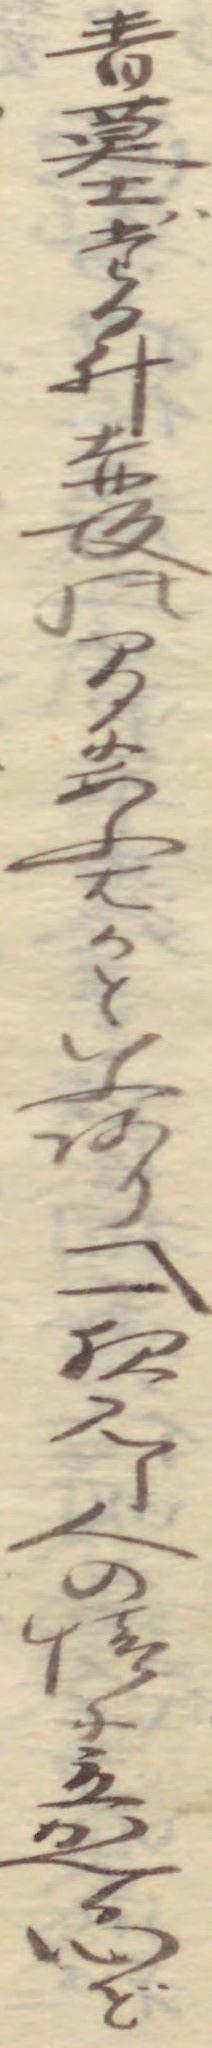青墓はたる井赤坂の間にあふはかといふあり〽一夜見し人の情に立かへる心ぞ
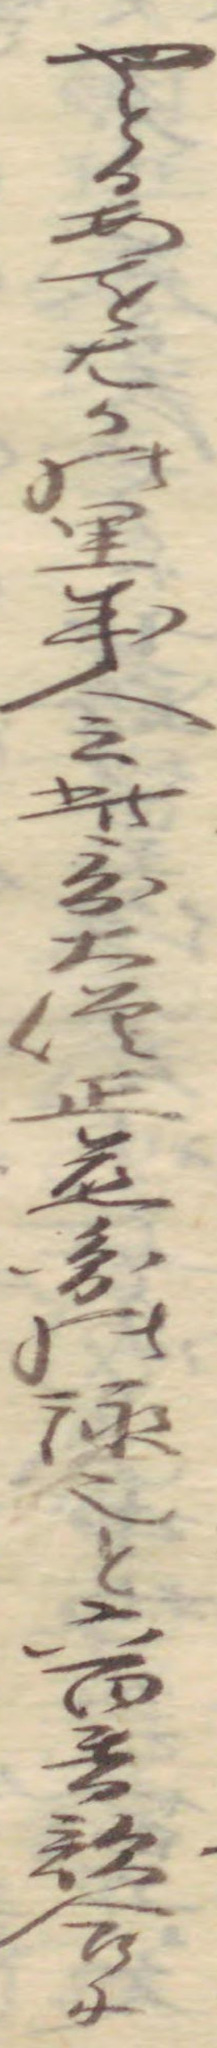やとるあをはかの里或人云此歌大僧正慈円の詠也と六百番歌合に
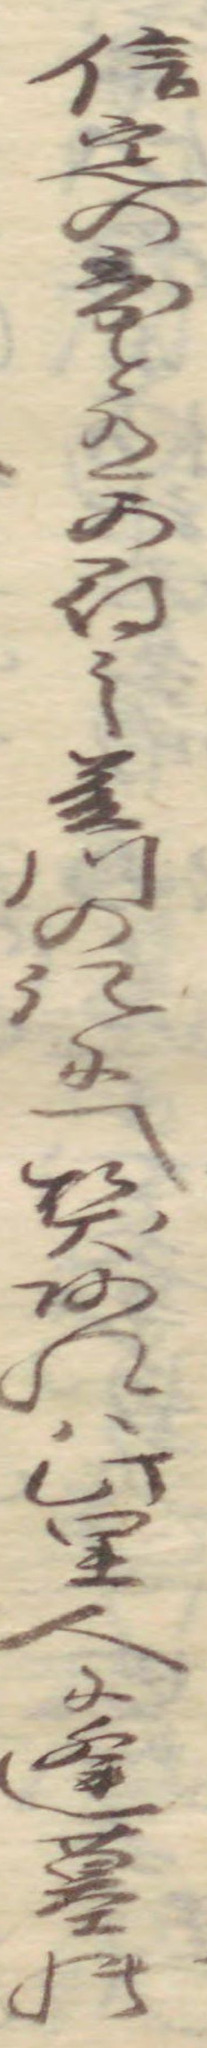信定の歌と有可尋之藤川の記に〽契あれは此里人に逢墓の
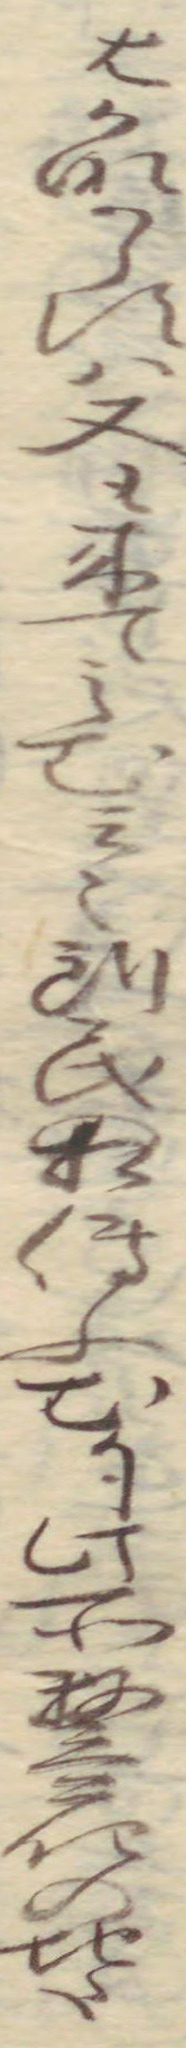はかなからすは又も来てみむ云〻所民相伝ふむかし此所繁花の地た
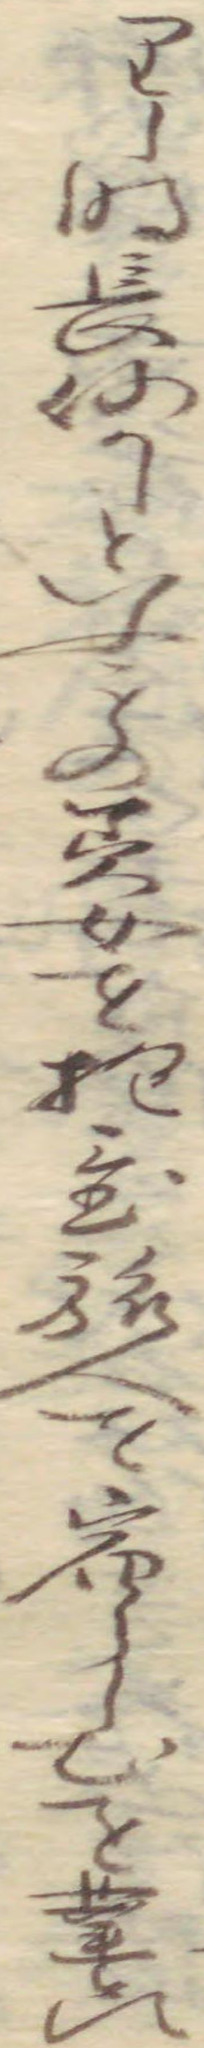りし時長何かしといふもの美女を抱置旅人を宿らしむを業とす
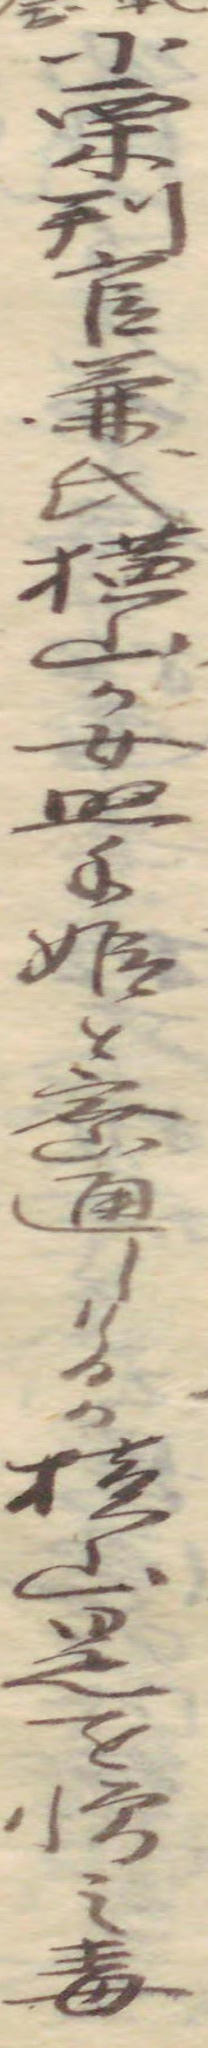小栗判官兼氏横山か女照手姫と密通しけるか横山是を憎み毒
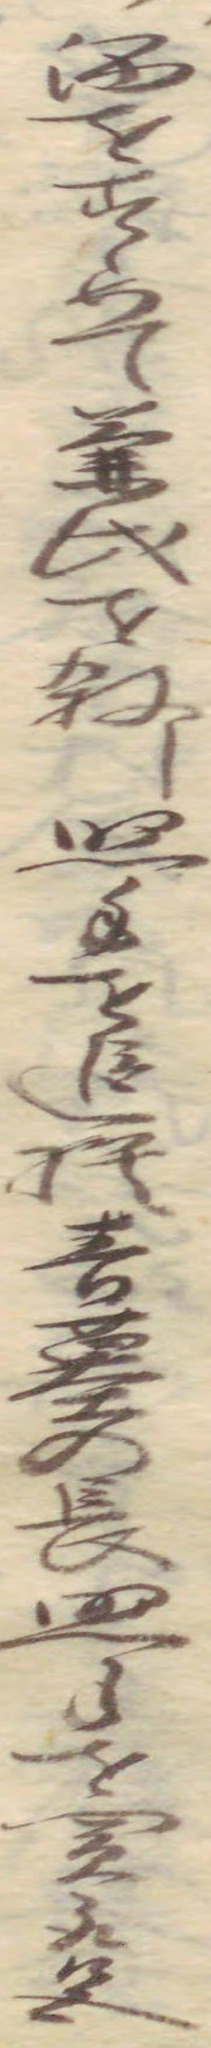酒をすゝめて兼氏を殺し照手を追捉青墓の長照手を買取色
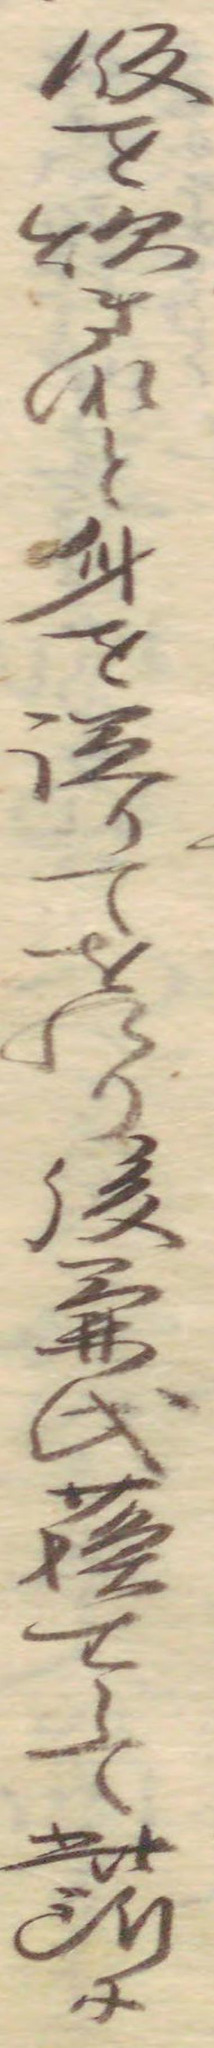飯を炊きなと身を謙りてをれり後兼氏蘇生して此所に
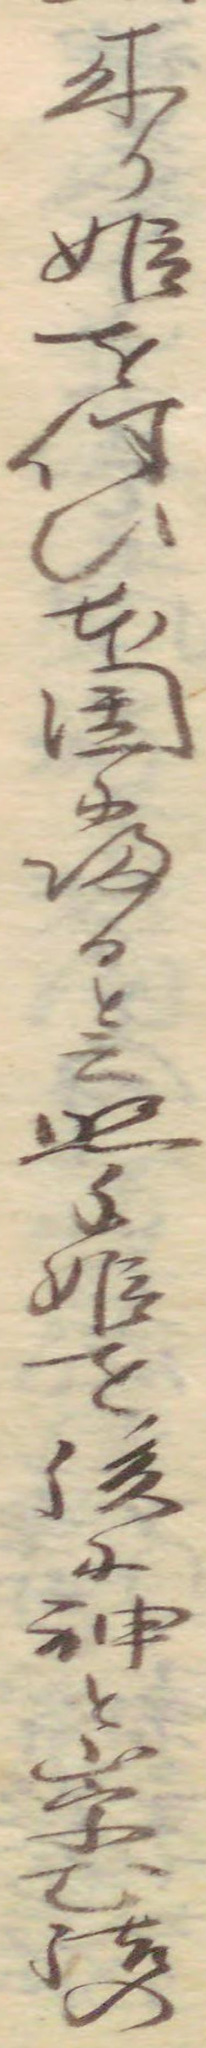来り姫を伴ひ本国に帰ると云照手姫を後に神と崇む結の

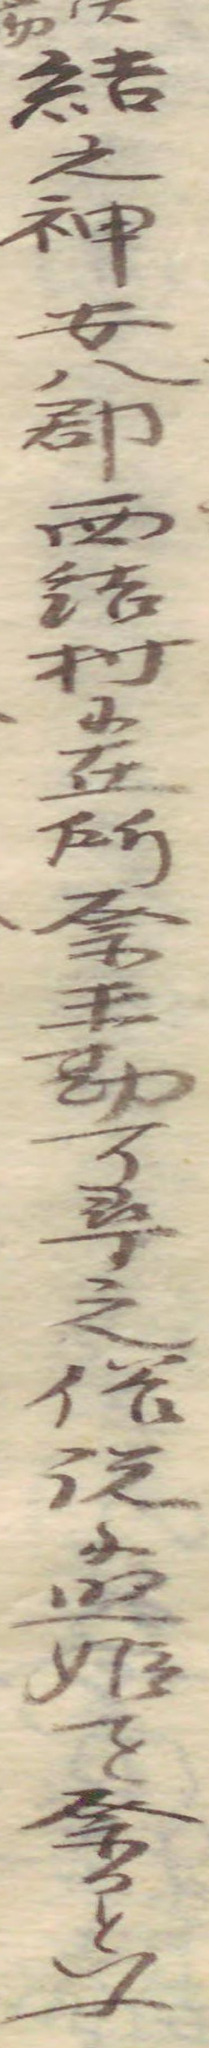結之神安八郡西結村に在所祭勘可尋之俗説に照姫を祭るといふ
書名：鶯宿雑記. 巻263-264
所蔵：国立国会図書館 National Diet Library, JAPAN
